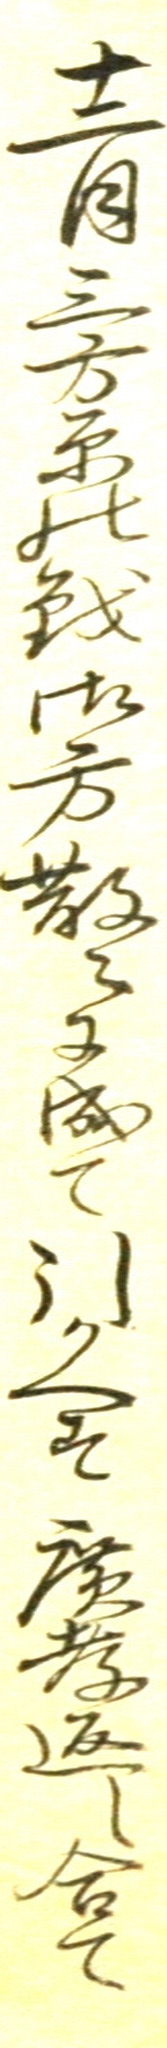十二月三方原の戦御方散々に成て引かへす廣孝返し合て

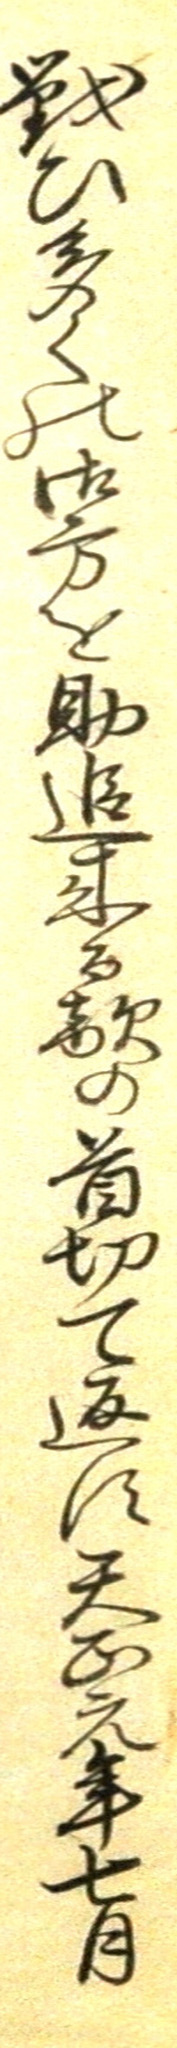戦ひ多くの御方を助追来る敵の首切て返す天正元年七月
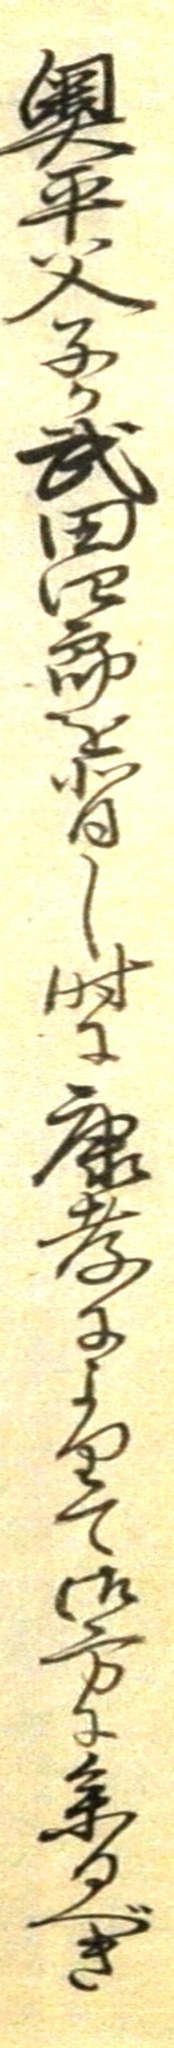奥平父子か武田四郎を背し時に康孝によりて御方に参るべき
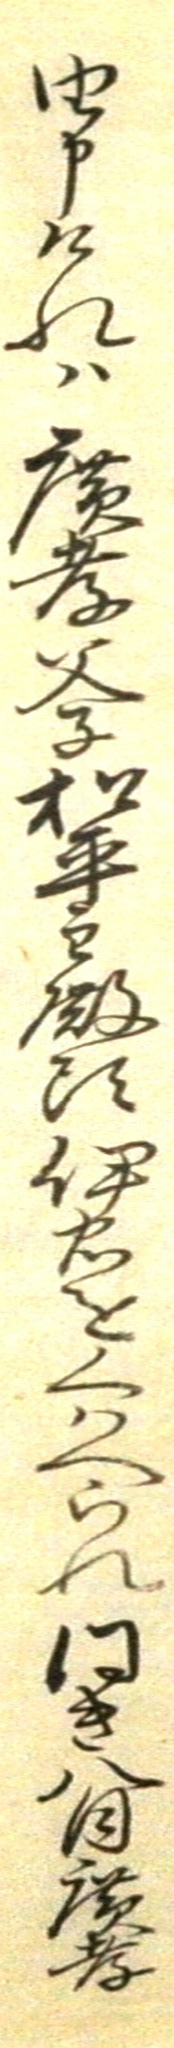由申けれは廣孝父子松平主殿頭伊忠をくはへられ同き八月廣孝
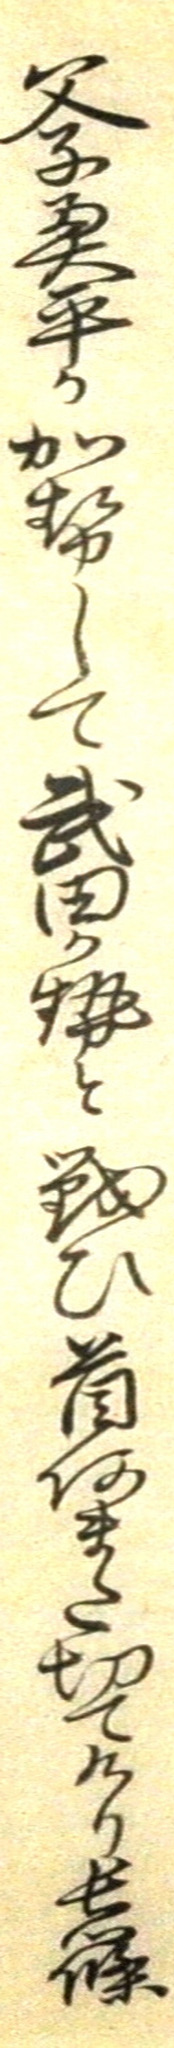父子奥平か加勢して武田か勢と戦ひ首あまた切てけり長篠
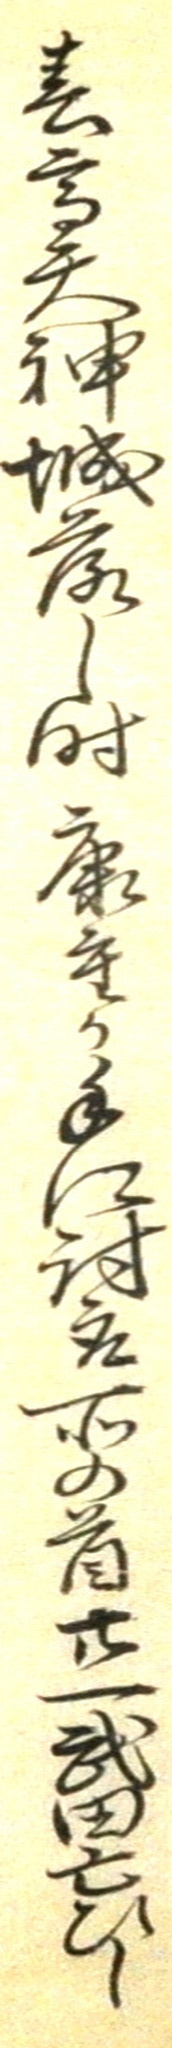春高天神城落し時康重か手に討取所の首廿一武田亡ひし
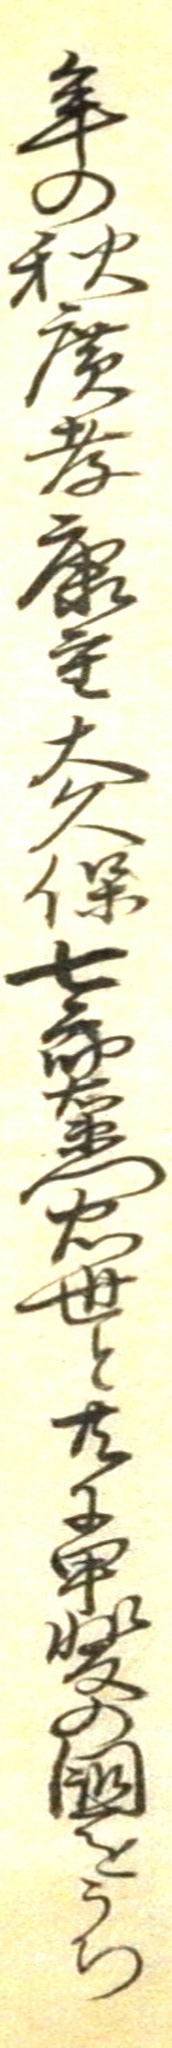年の秋廣孝康重大久保七郎右衛門忠世と共に甲斐の国をうち
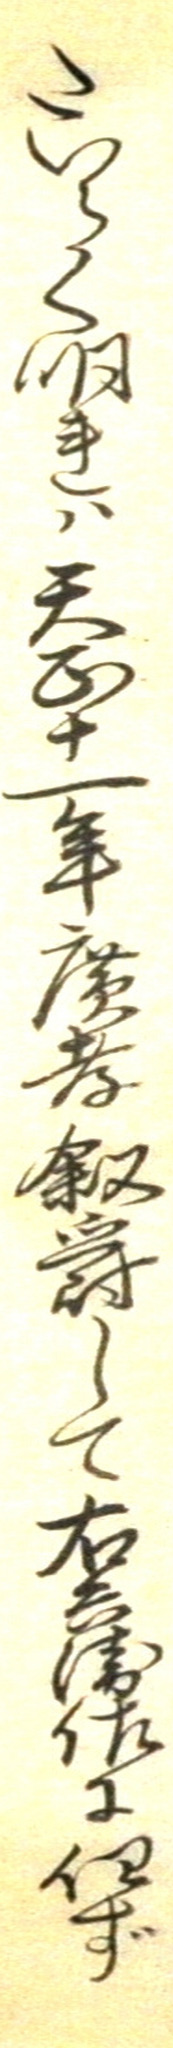たいらく明れは天正十一年廣孝叙爵して右兵衛佐に任ず
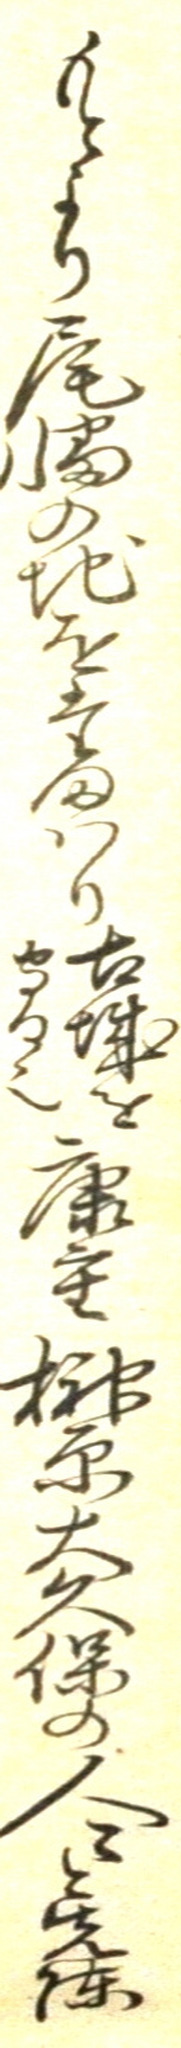もとより尾幡の地をたまはり古城を守る也康重榊原大久保の人々と先陣
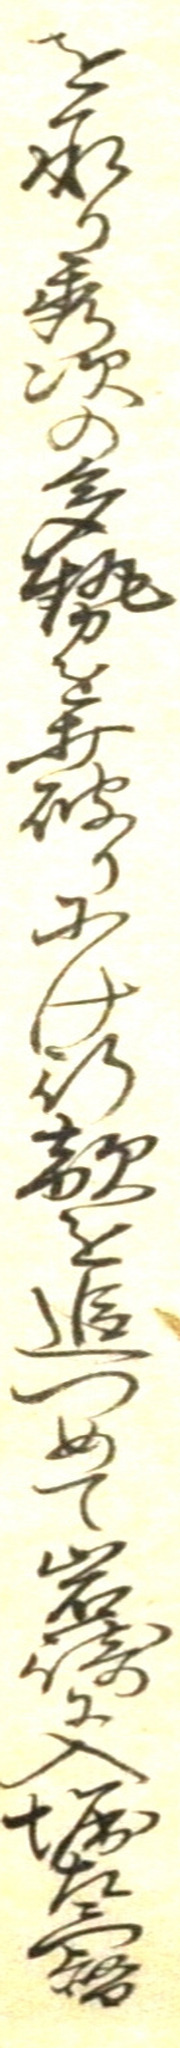を承り秀次の多勢を打破りにけ行敵を追つめて岩崎に入堀左ヱ門督
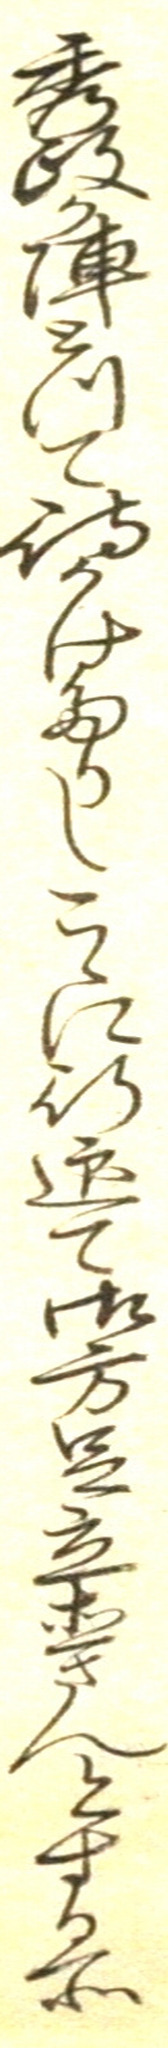秀政か陣とつて待かけたりしこゝに行迎て味方足立直さんとする所
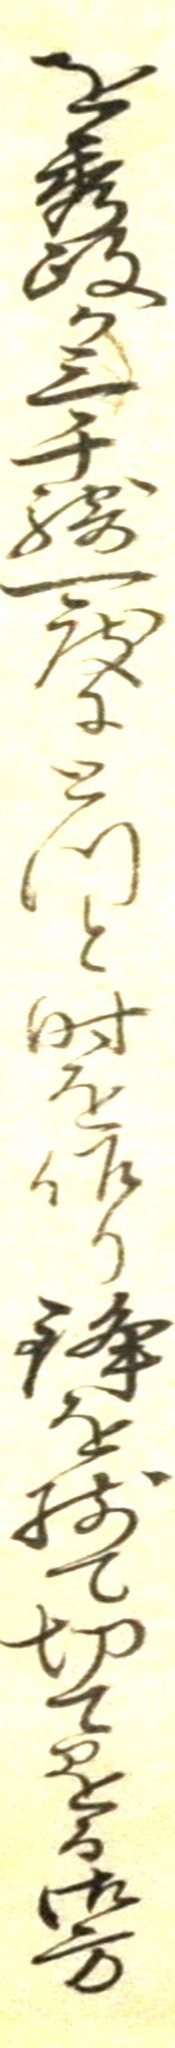を秀政か三千騎一度にとつと時を作り鋒を揃て切て懸る御方
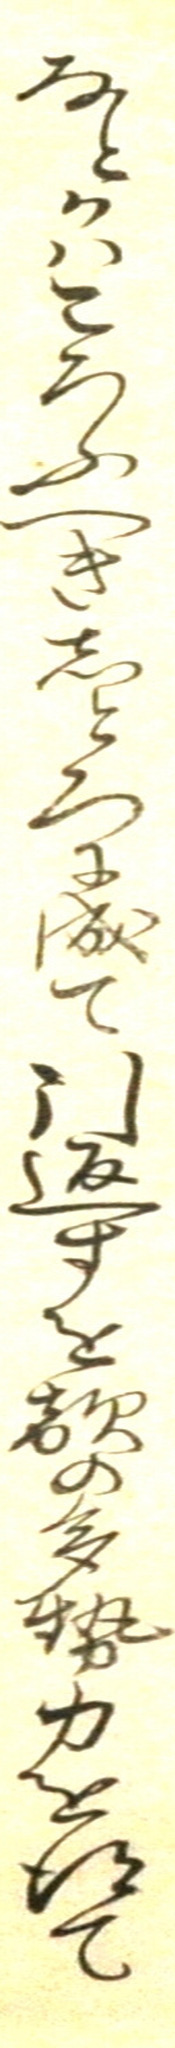なとかはころふへきしとろに成て引返すを敵の多勢力を得て
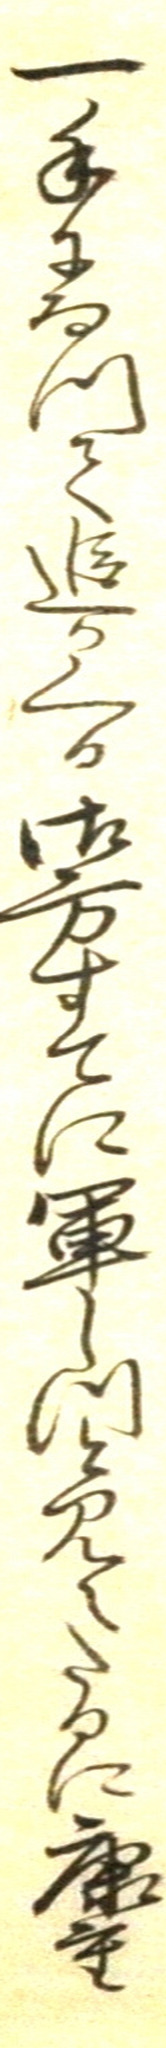一手になつて追かくる御方すてに軍しつと見えたるに康重
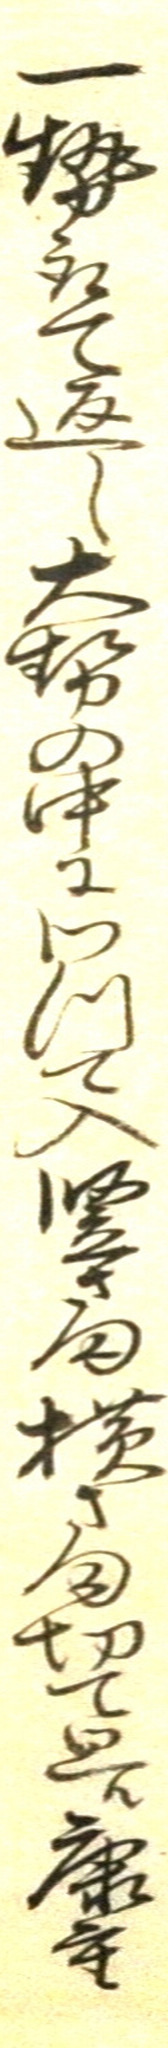一勢取て返し大勢の中にわつて入竪さま横さま切て廻ル康重
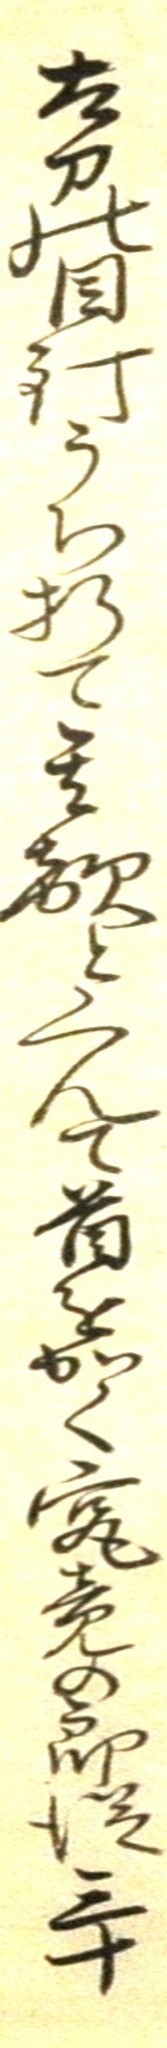左刀の目釘うち折て其敵とくんて首をかく究竟の郎従三十
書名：藩翰譜（四・上）
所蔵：伊那市立高遠町図書館・合同会社AMANE
